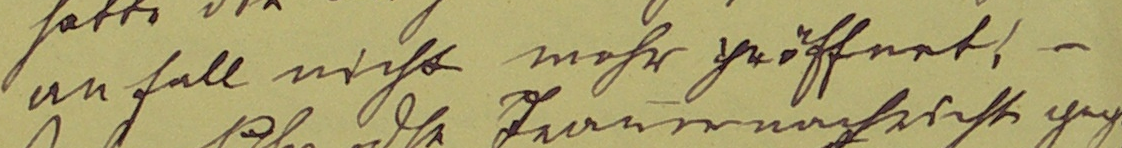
anfall nicht mehr geöffnet !-
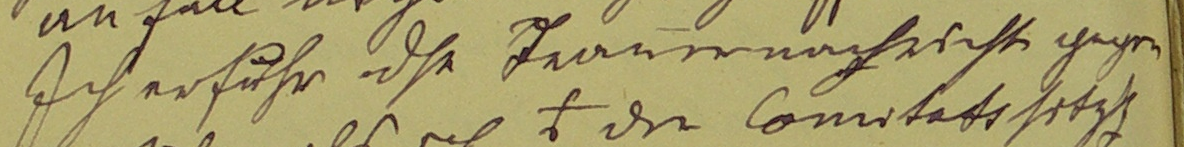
Ich erfuhr diese Trauernachricht gegen
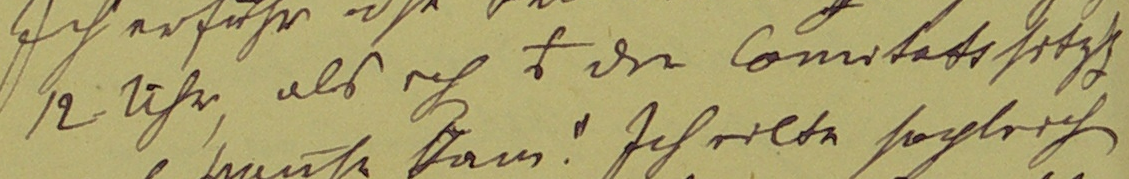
12 Uhr, als ich ausd er Commitatssitzung
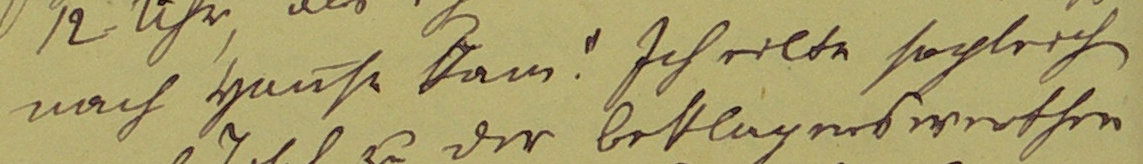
nach Hause kam ! Ich eilte sogleich
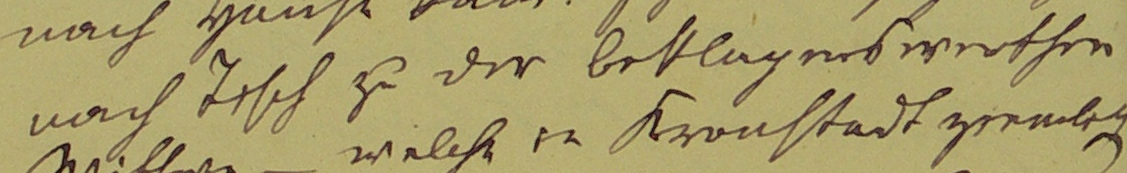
nach Tisch zu der beklagenswerten
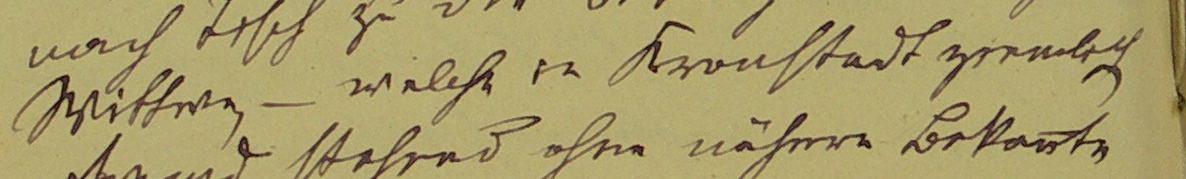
Witwe,- welche in Kronstadt ziemlich
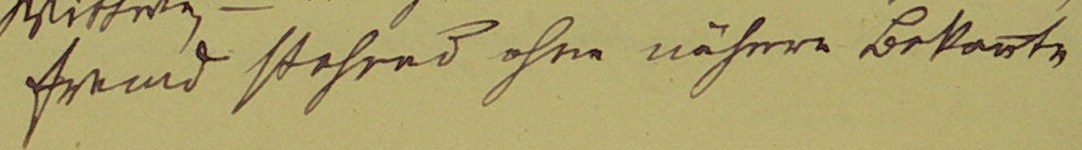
fremd stehend ohne nähere Bekannte
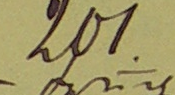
201
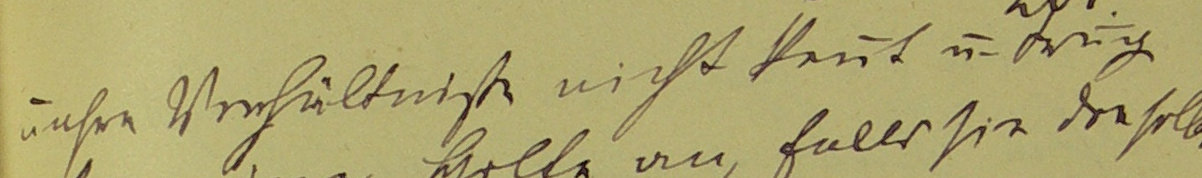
unsere Verhältniße nicht kennt und trug
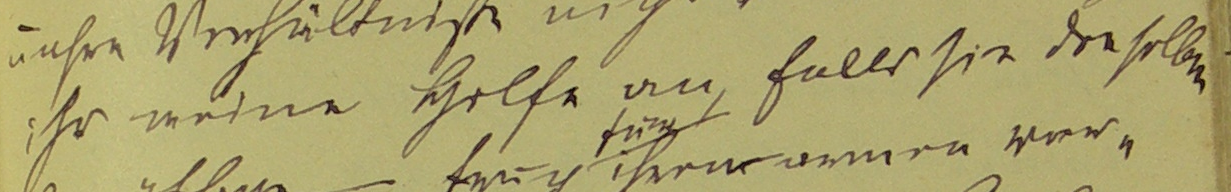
ihr meine Hilfe an, falls sie dieselbe
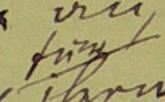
für
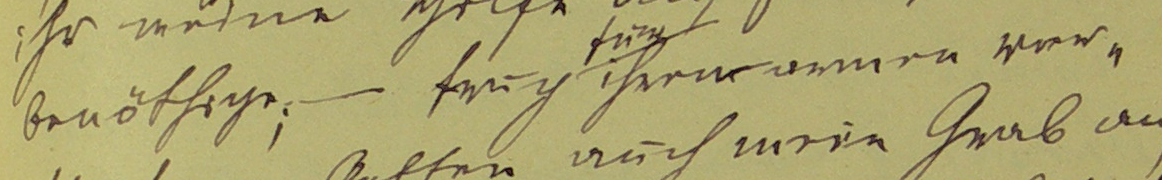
benöthige;-- trug ihren armen ver¬
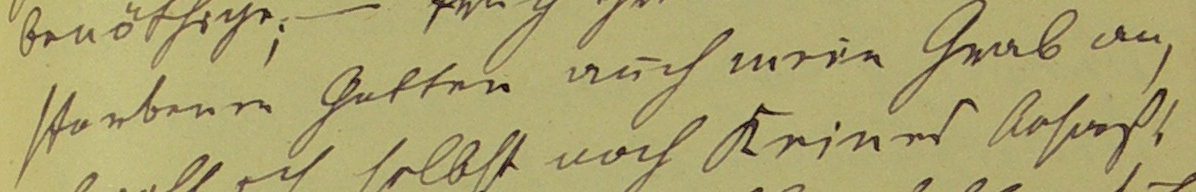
storbenen Gatten auch mein Grab an ,
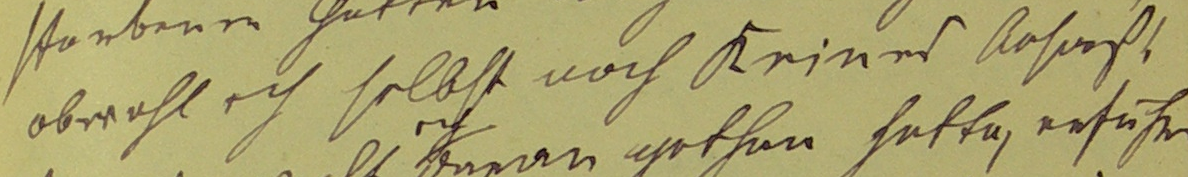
obwohl ich selbst noch keines besaß.!
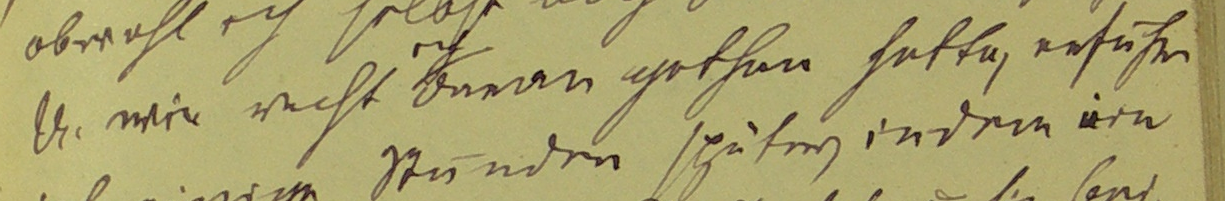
Und wie recht ich daran gethan hatte , erfuhr
